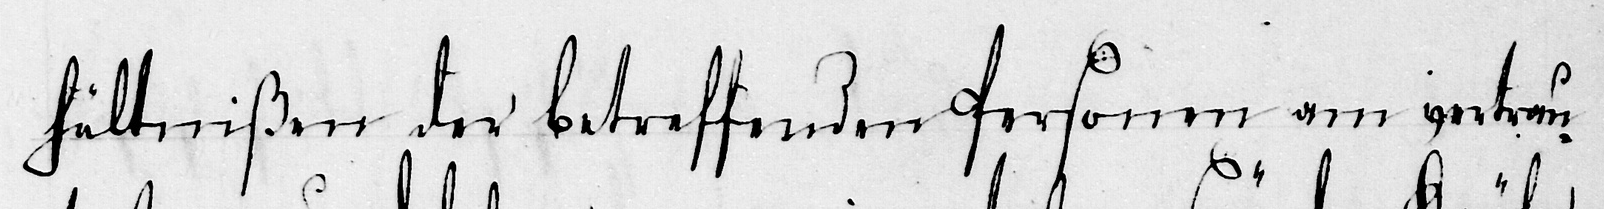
hältnißen der betreffenden Personen am vertrau¬
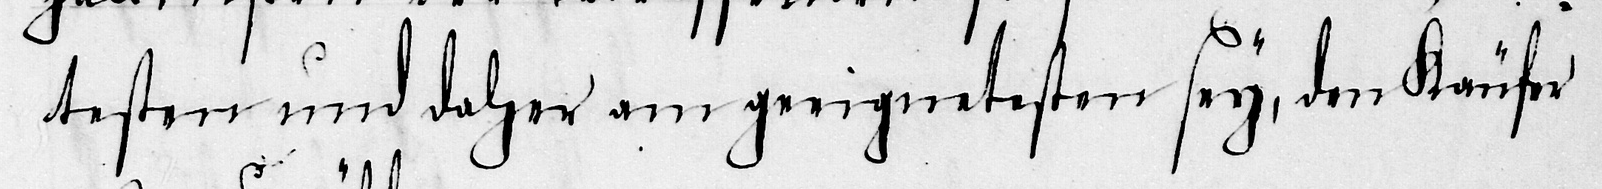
testen und daher am geeignetesten sey, den Käufer
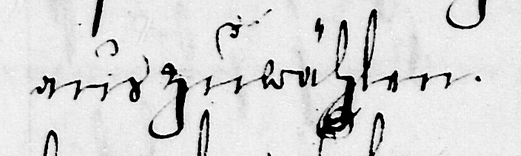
auszuwählen.
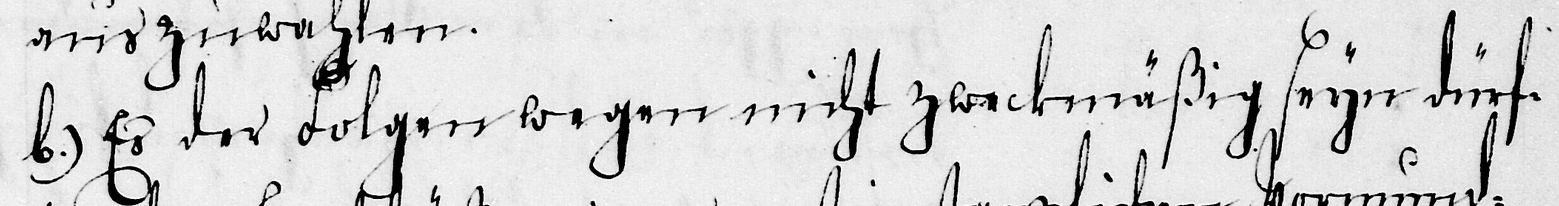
b.) Es der Folgen wegen nicht zweckmäßig seyn dürf¬
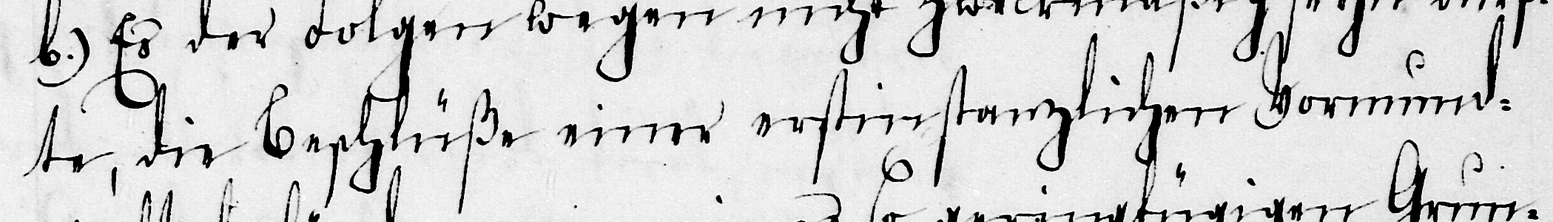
te, die Beschlüße einer erstinstanzlichen Vormund¬
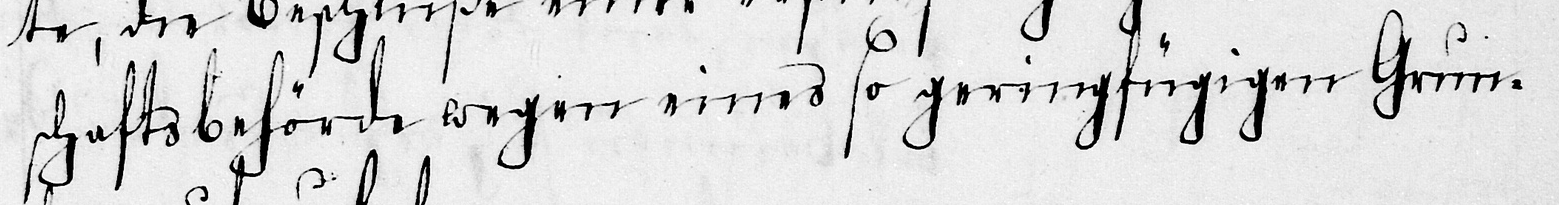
schaftsbehörde wegen eines so geringfügigen Grun¬
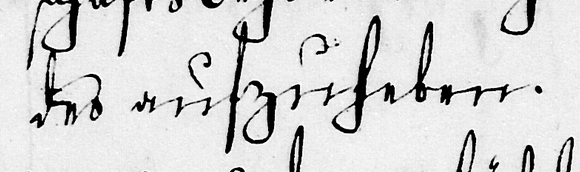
des aufzuheben.
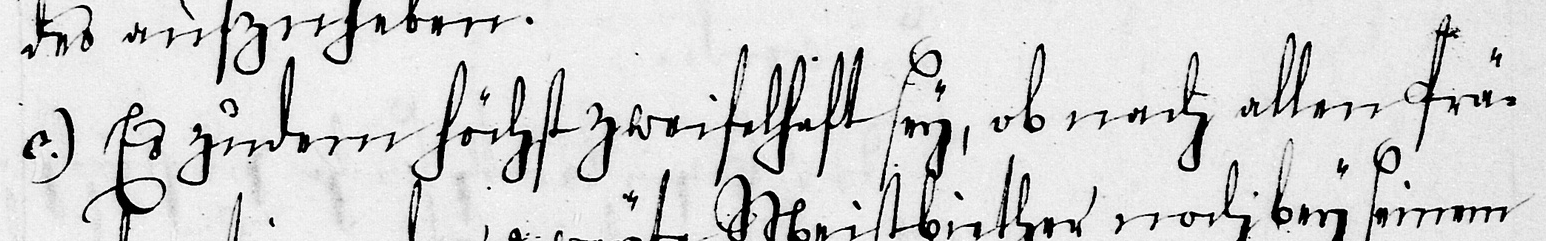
c.) Es zudem höchst zweifelhaft sey, ob nach allen Prä¬
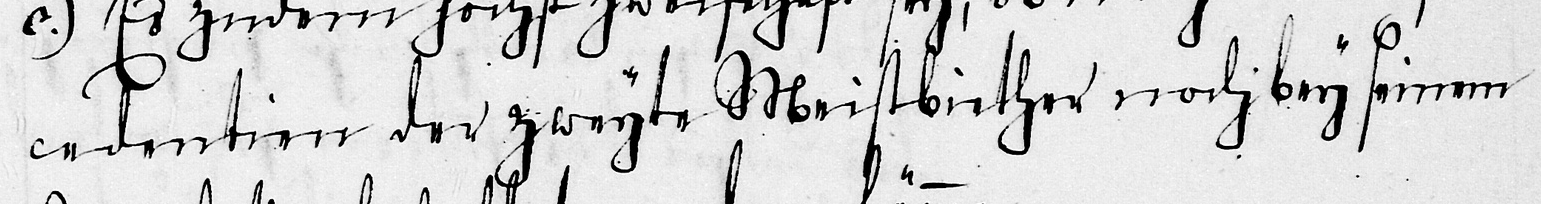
cedentien der zweyte Meistbiether noch bey seinem
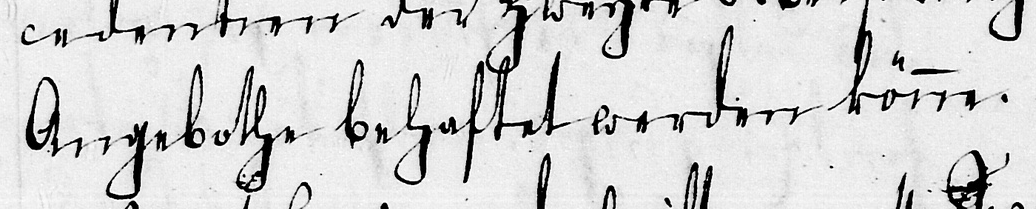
Angebothe behaftet werden könne.
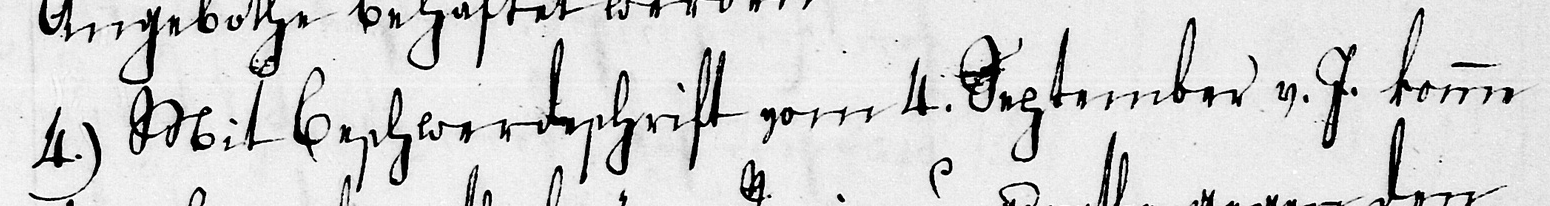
4.) Mit Beschwerdeschrift vom 4. September v. J. komme
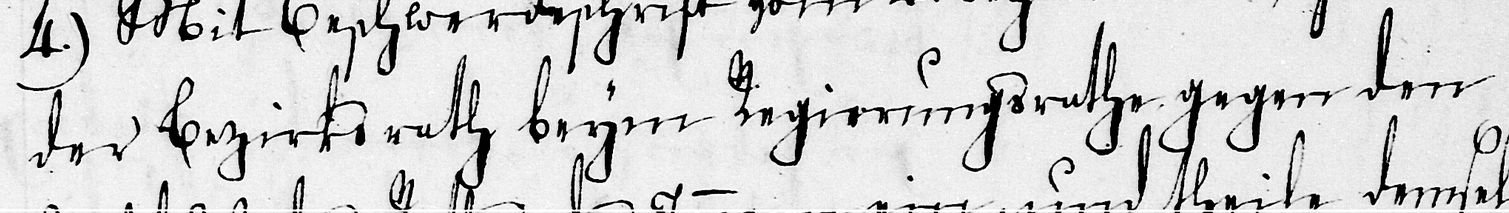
der Bezirksrath beym Regierungsrathe gegen den
